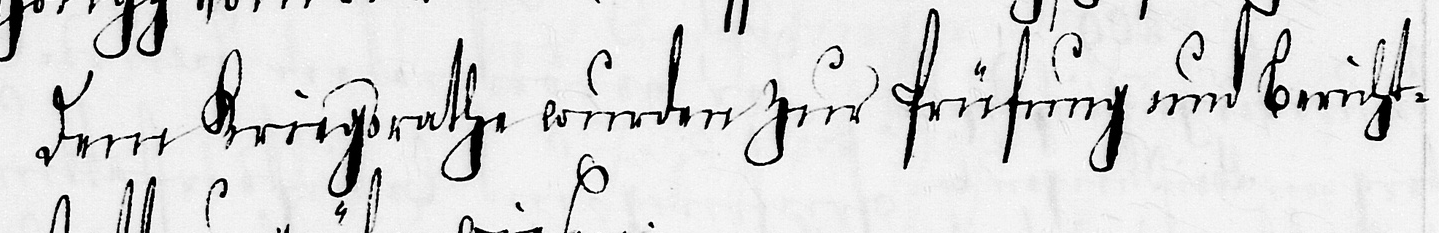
Dem Kriegsrathe wurden zur Prüfung und Bericht¬
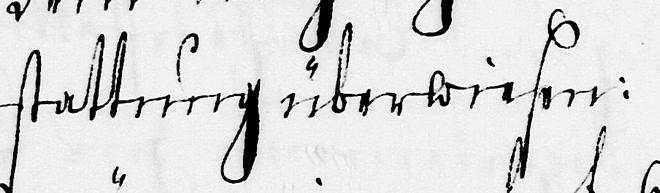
stattung überwiesen:
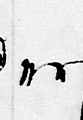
er¬
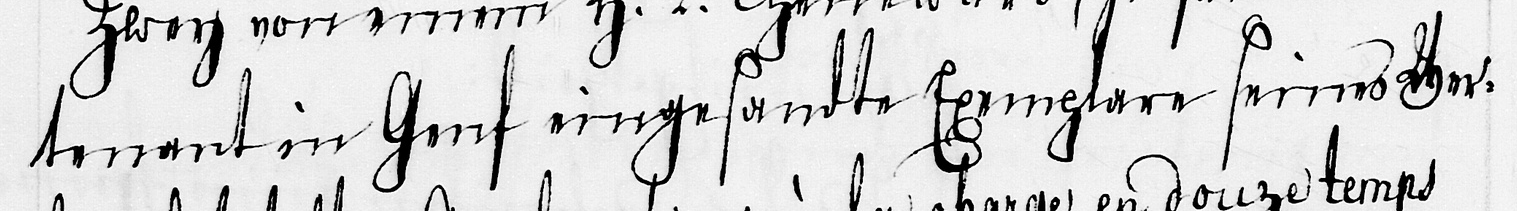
tenant in Genf eingesandte Exemplare seines Wer¬
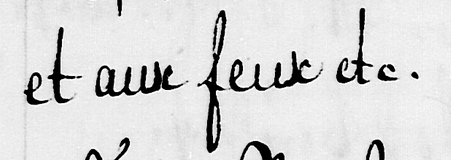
et aux feux etc.
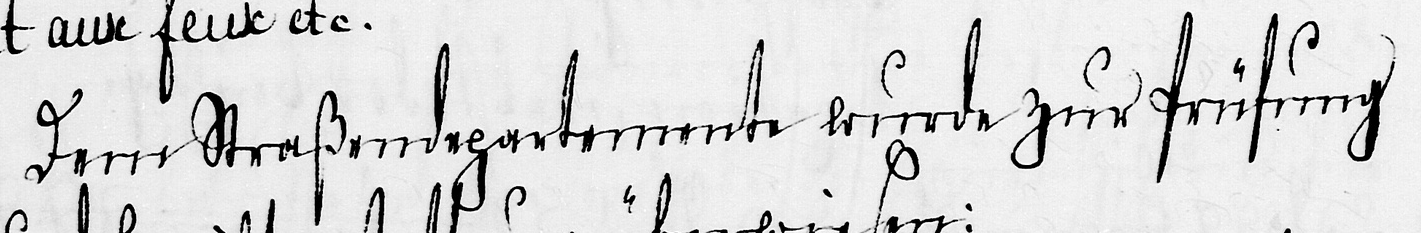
Dem Straßendepartemente wurde zur Prüfung
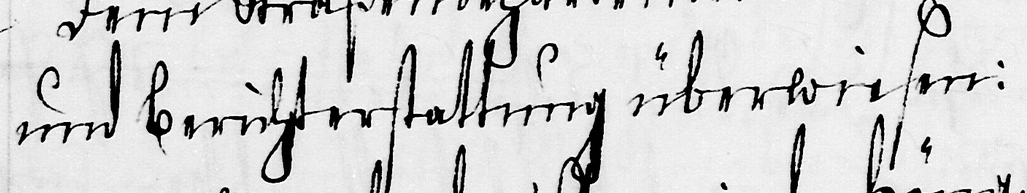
und Berichterstattung überwiesen:
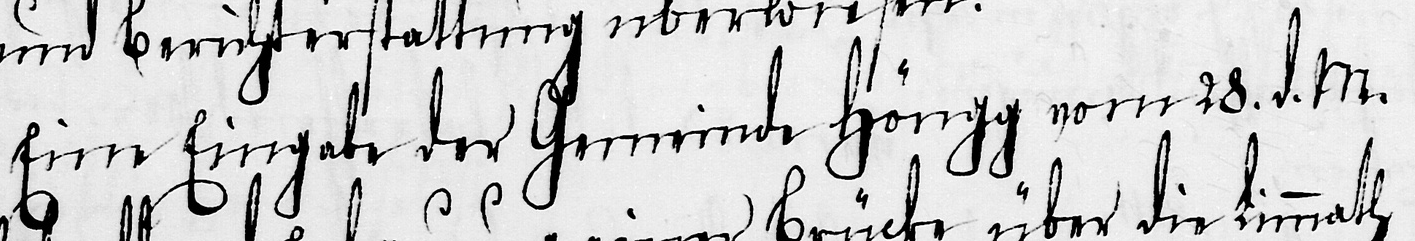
Eine Eingabe der Gemeinde Höngg vom 28. d. M.
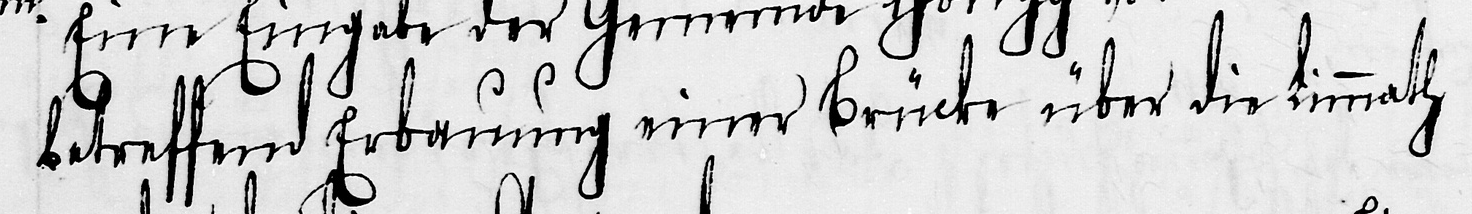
betreffend Erbauung einer Brücke über die Limmath
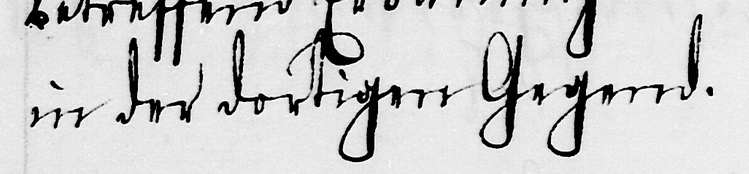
in der dortigen Gegend.
